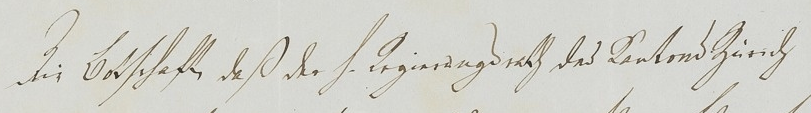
Die Botschaft, daß der h. Regierungsrath des Kantons Zürich
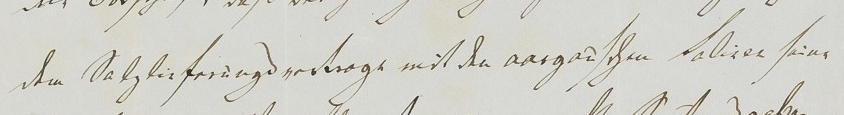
dem Salzlieferungsvertrage mit den aargauschen Salinen seine
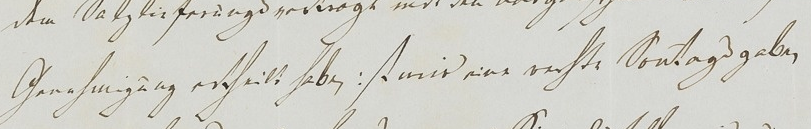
Genehmigung ertheilt habe, ist mir eine rechte Sonntagsgabe,
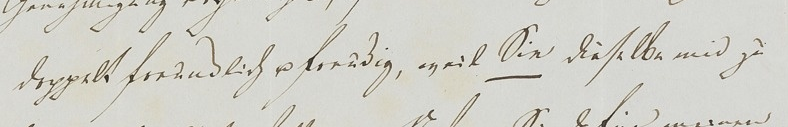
doppelt freundlich & freudig, weil Sie dieselbe mir zu
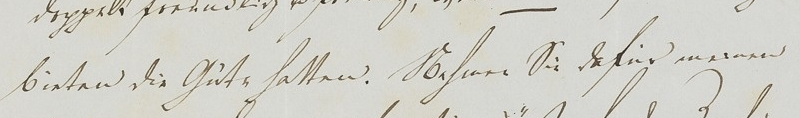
bieten die Güte hatten. Nehmen Sie dafür meinen
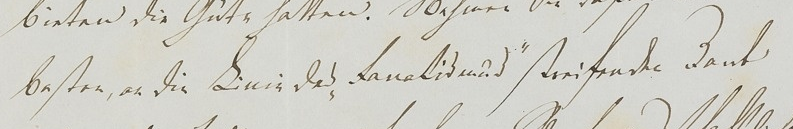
besten, an die Linie des «Fanatismus» streifenden Dank
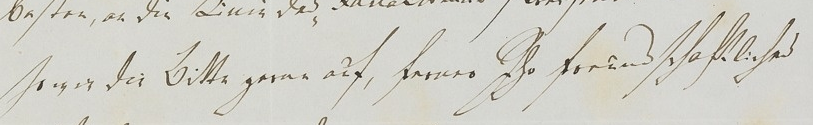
sowie die Bitte gerne auf, ferner Ihr freundschaftliches
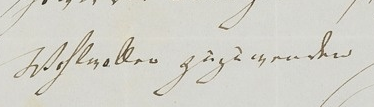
Wohlwollen zuzuwenden
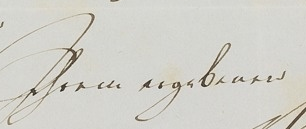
Ihrem ergebenen
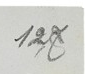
1851.
